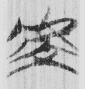虔
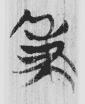秉
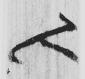氒
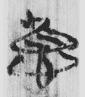惪
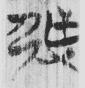{人乍又}
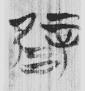辟
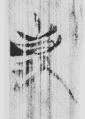事
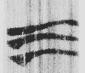三
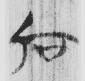后
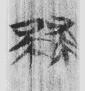{㣇聿}
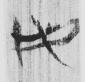女
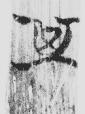𠀠
